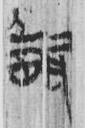䎽（問）
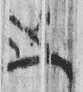之
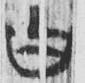曰
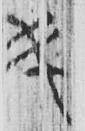民
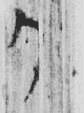人
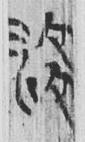流
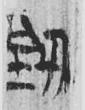型（形）
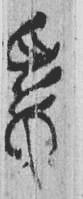○（奚）
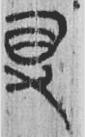○（得）
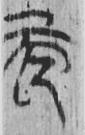而
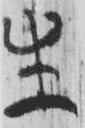生
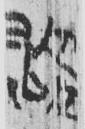流
